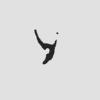曰
